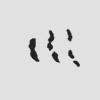川
